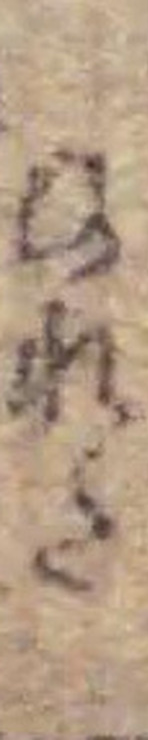ひれた
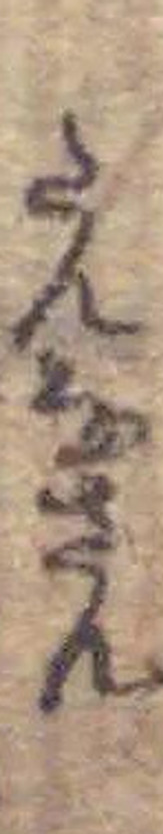たんなさん
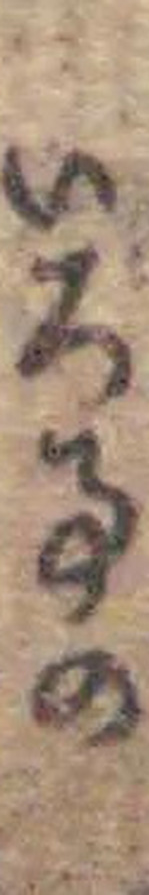いろ事の
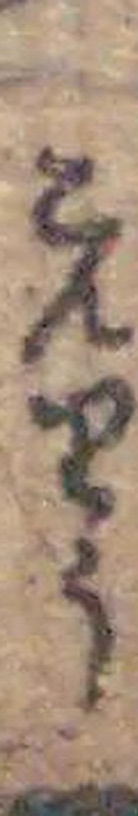こんりう

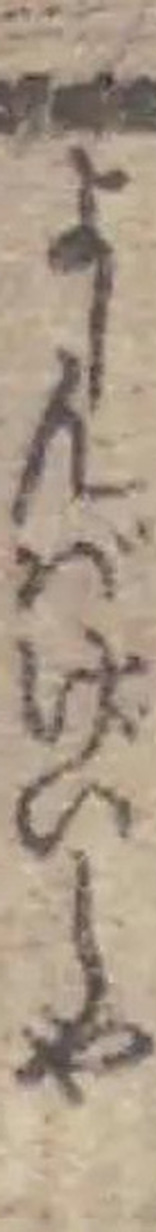よしんばけいしや
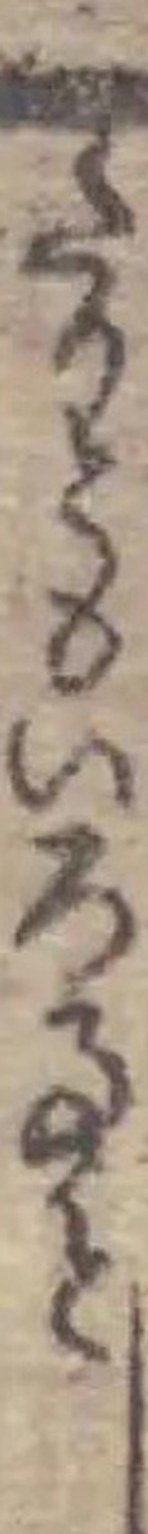たりともいろ事と
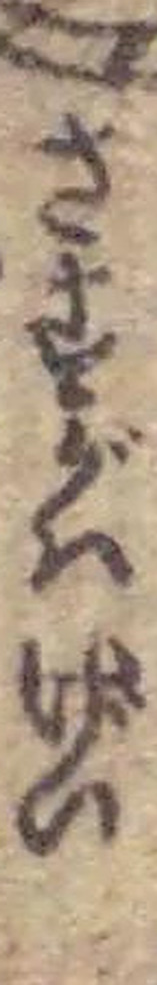さすがはげい
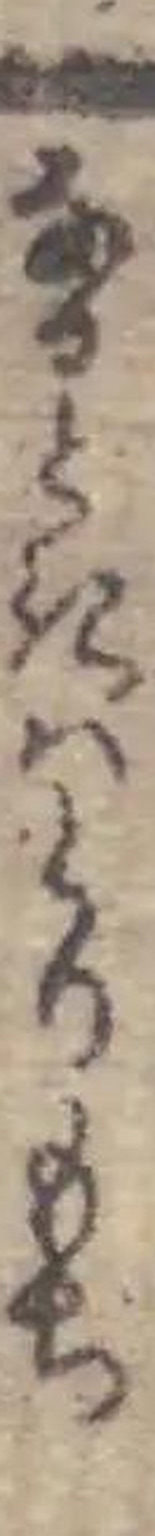なるときはとりもち
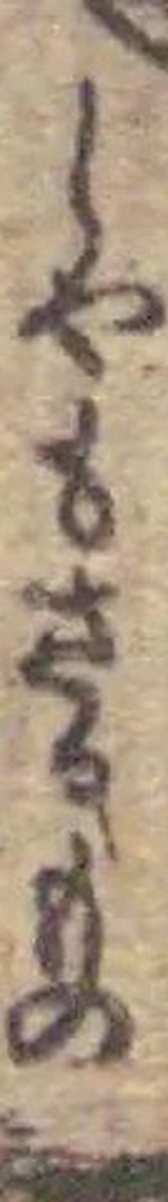しやもさるもの
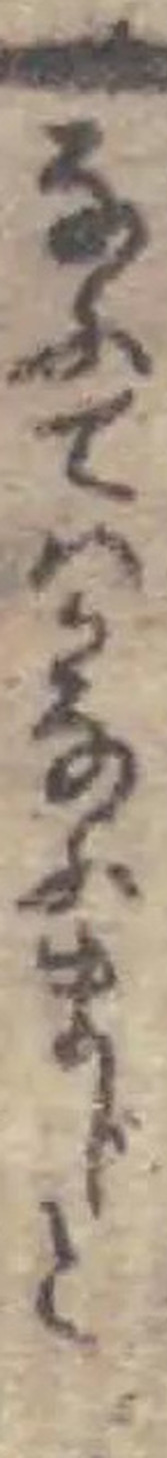なふてはかなふまじと
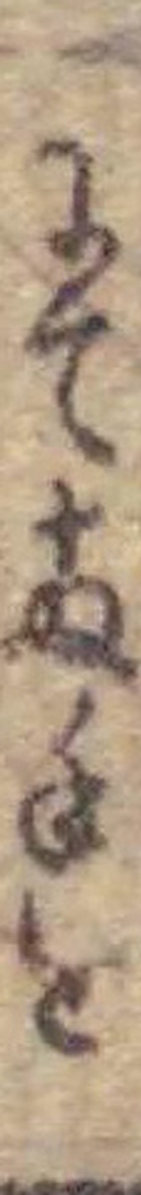にて両手を
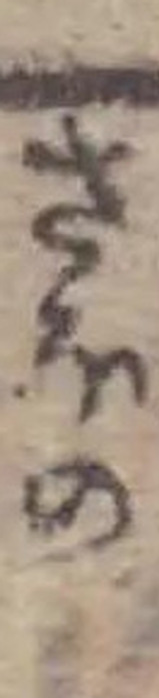さほの
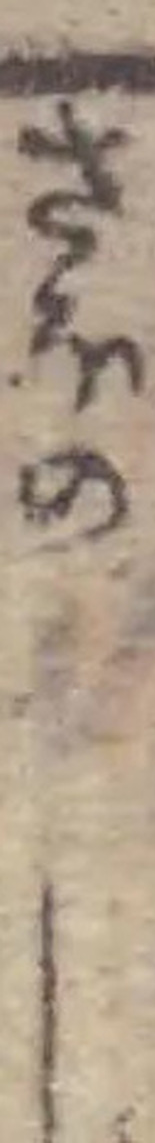さほの
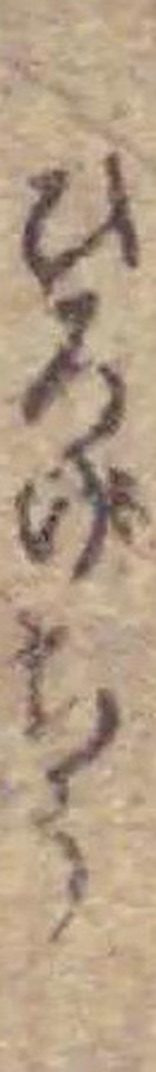ひろげちう
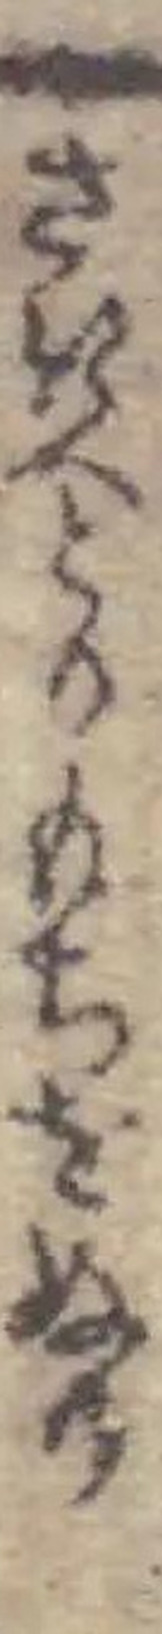さきへとりもちをぬり
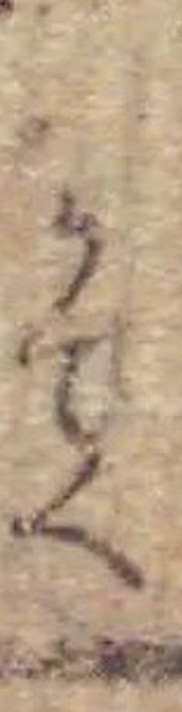かてへ
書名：色男其処此処 3巻
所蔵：国立国会図書館 National Diet Library, JAPAN
